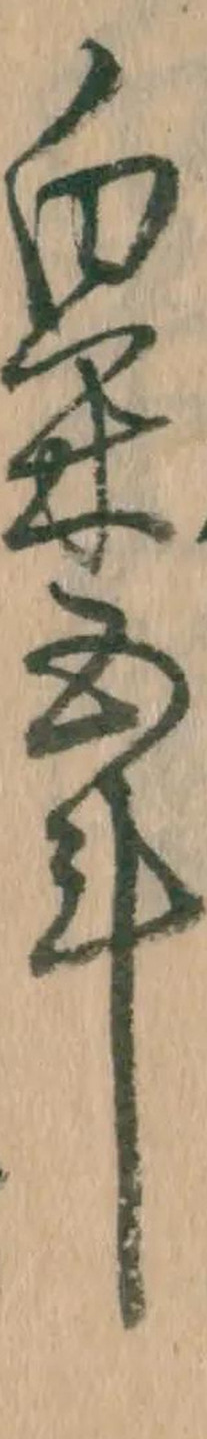白米壱斗
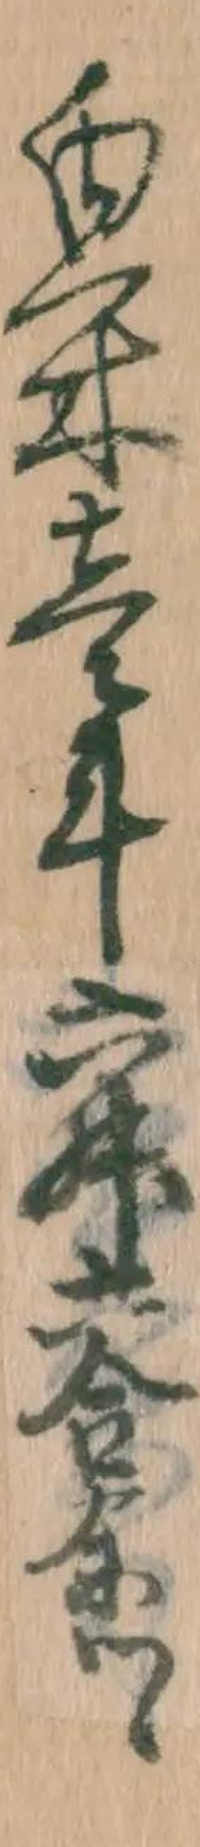白米壱斗六升六合余ツヽ
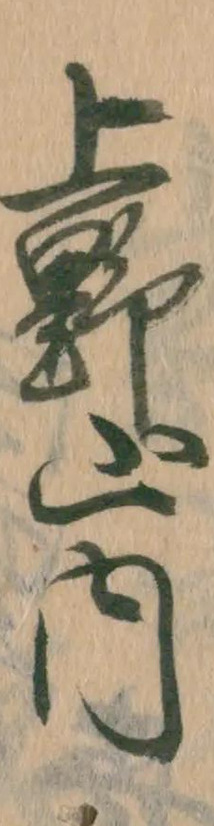上野山内
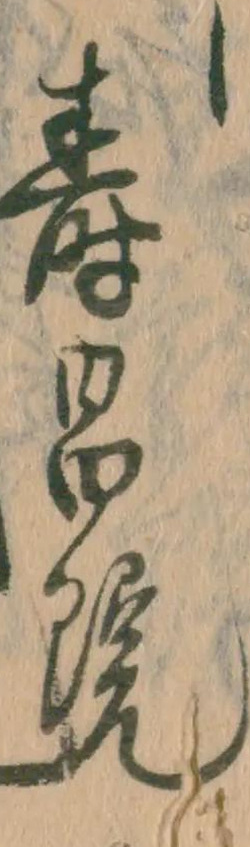寿昌院
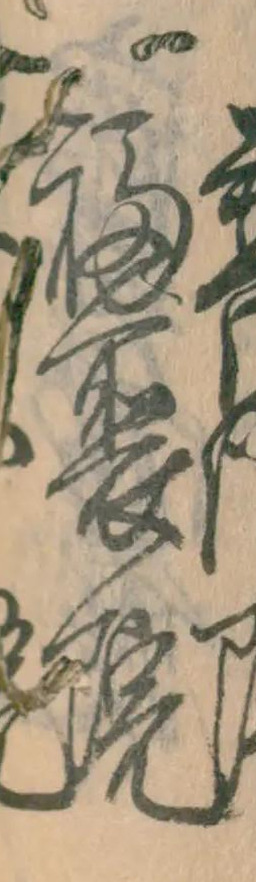福聚院
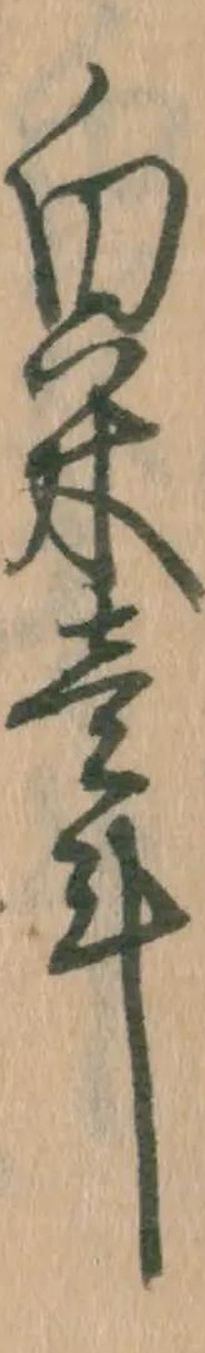白米壱斗
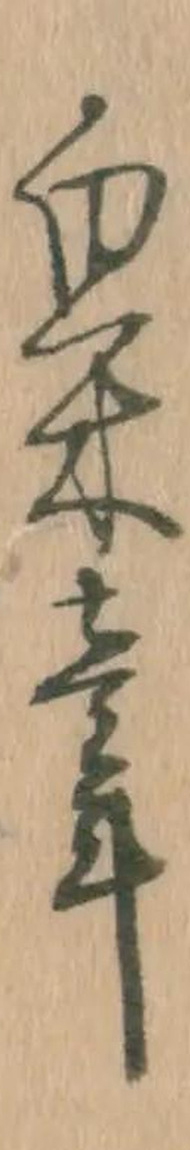白米壱斗
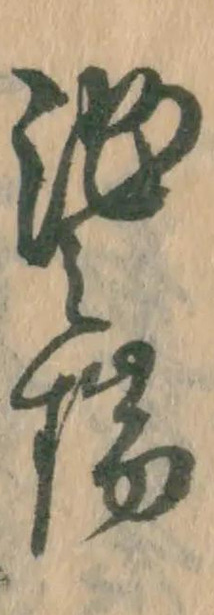池之端
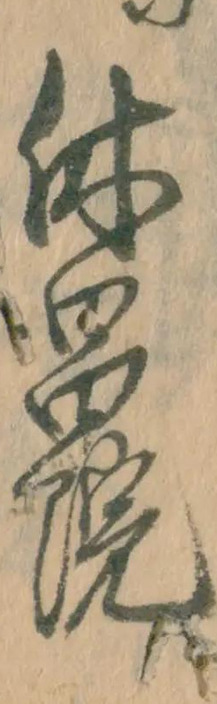休昌院

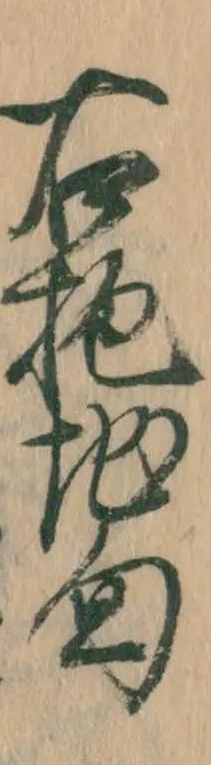右抱地面
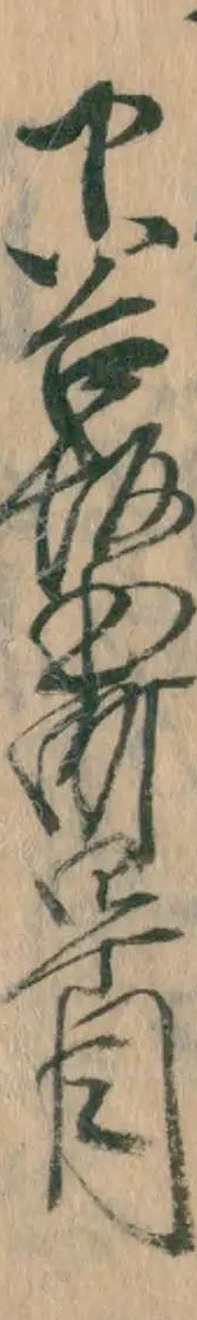下谷坂本町四丁目
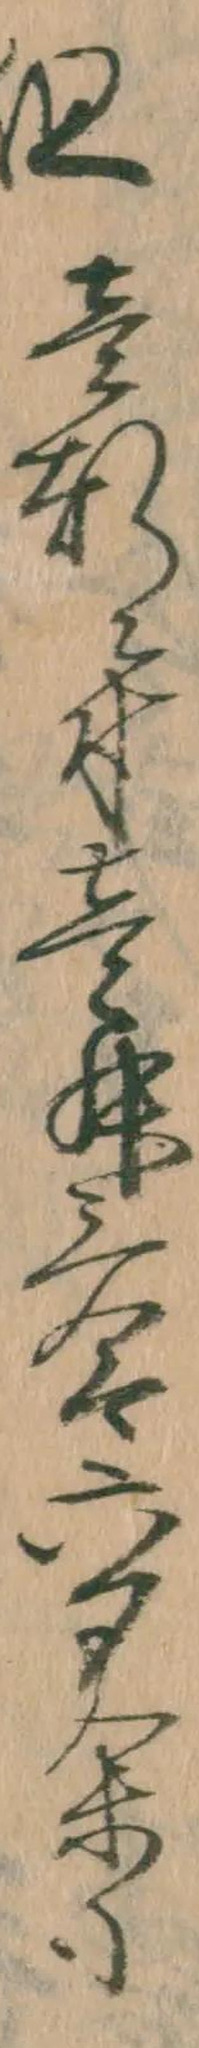但壱軒ニ付壱升三合六勺余ツヽ
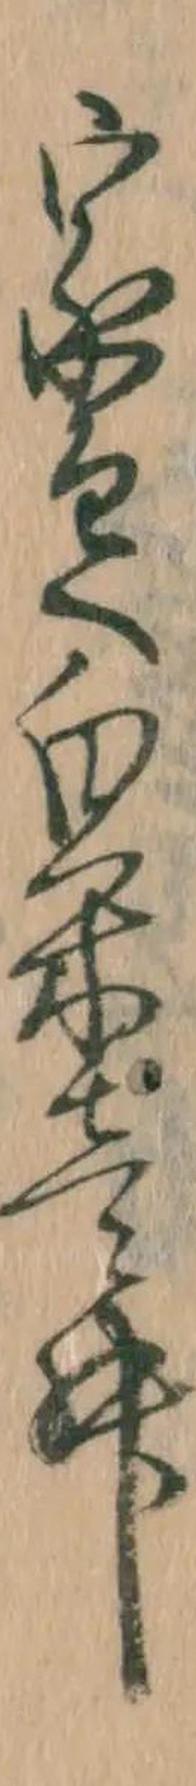家主へ白米壱升
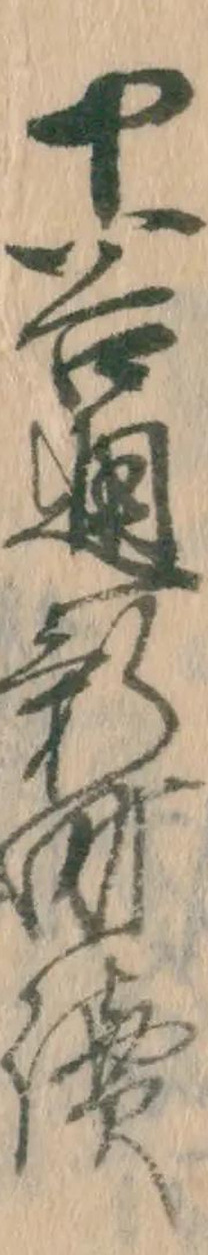下谷通新町続
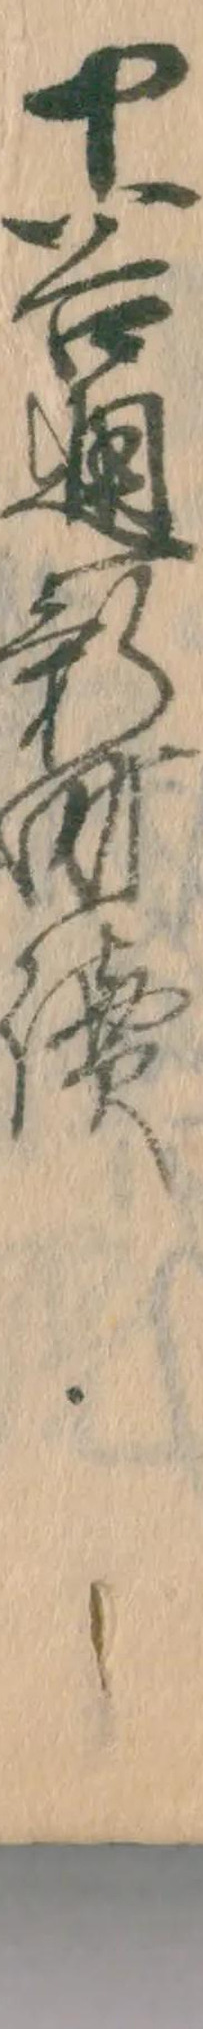下谷通新町続
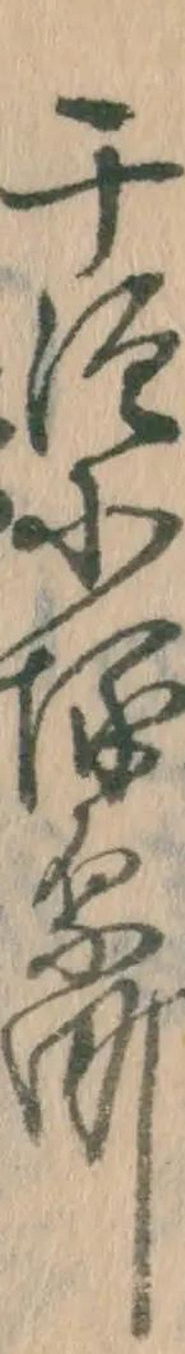千住小塚原町
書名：武家方并寺院等ニテ施差出候一件
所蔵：国立国会図書館 National Diet Library, JAPAN
